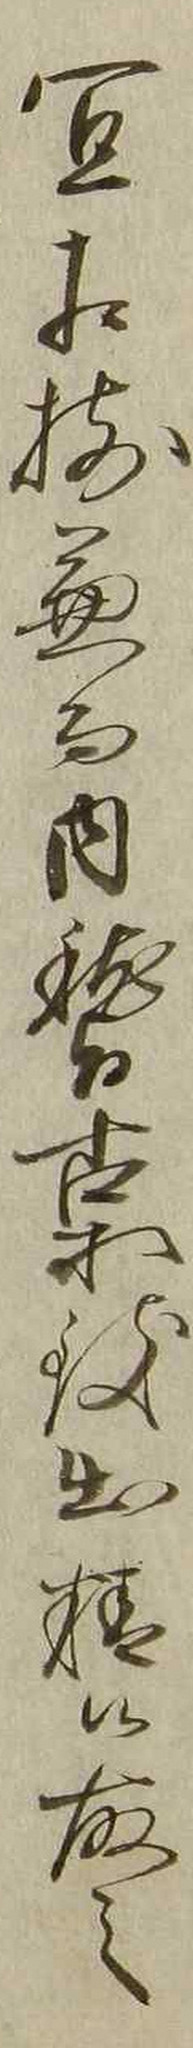宜相揃兼而内稽古等致出精候故之
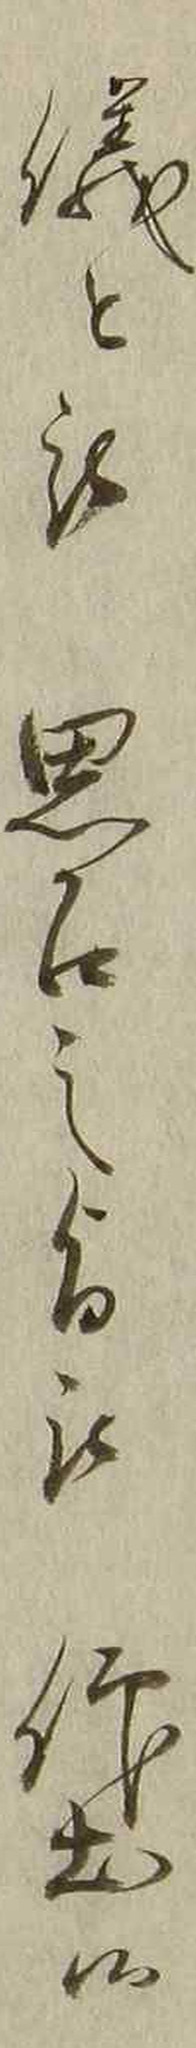儀と被思召之旨被仰出候
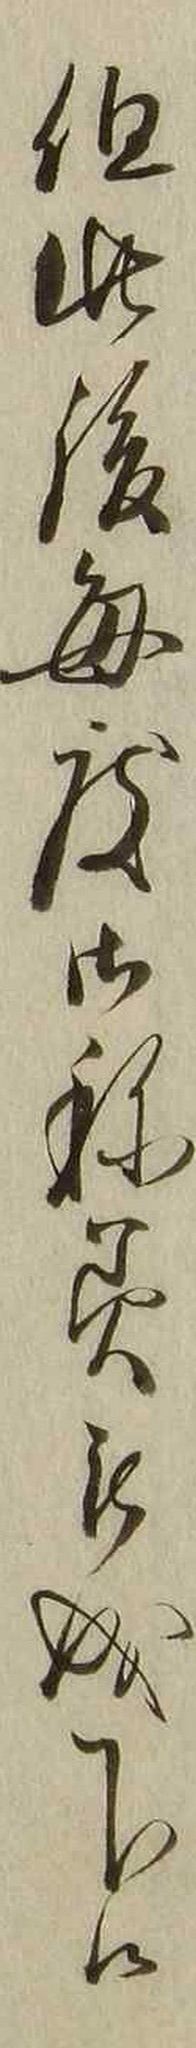但此後毎度御称美被成下候
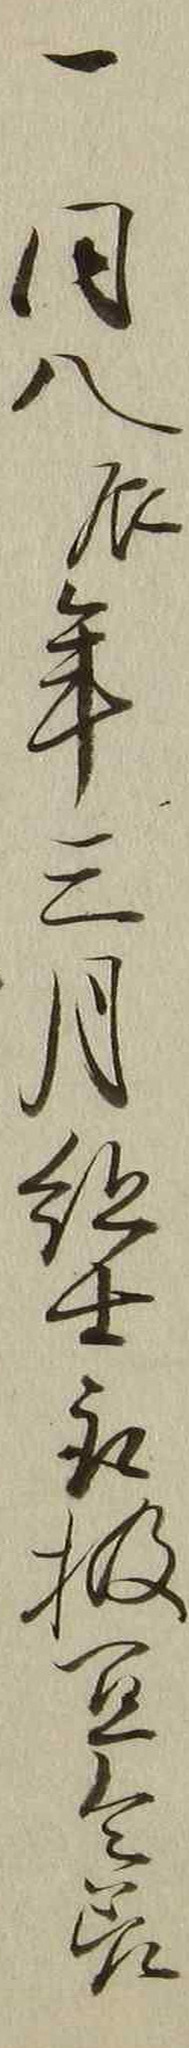一同八辰年三月組士取扱宜令差
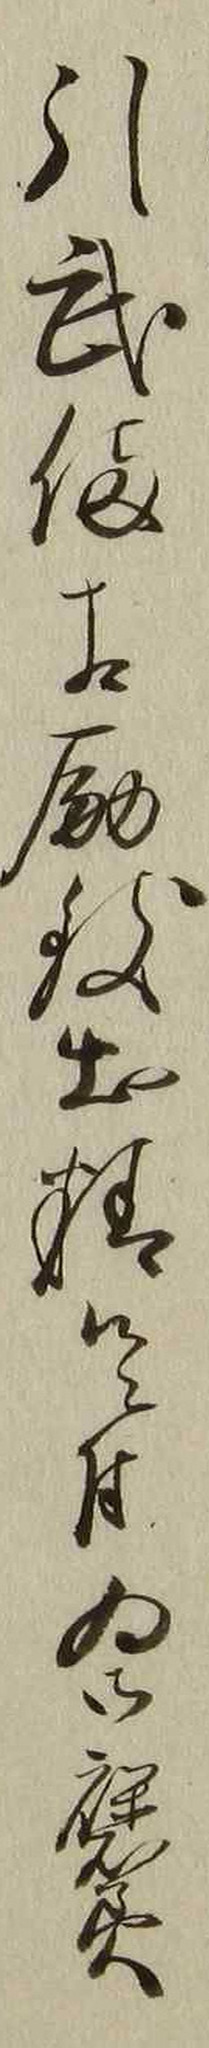引武備相励致出精候に付為御褒美
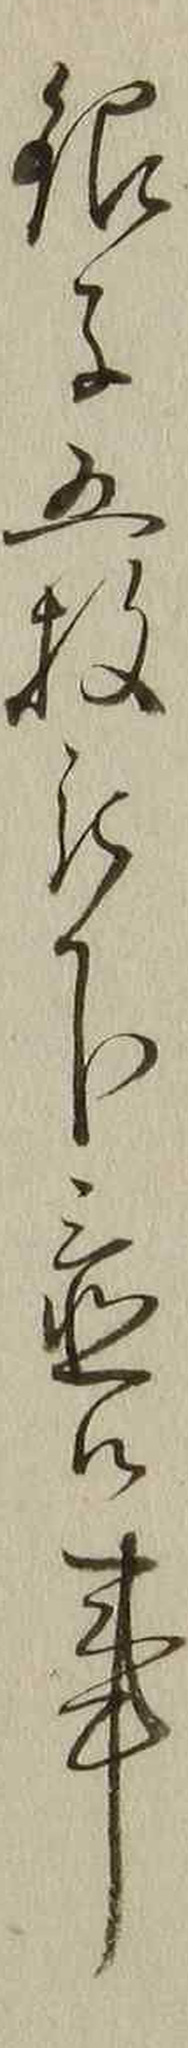銀子五枚被下置候事
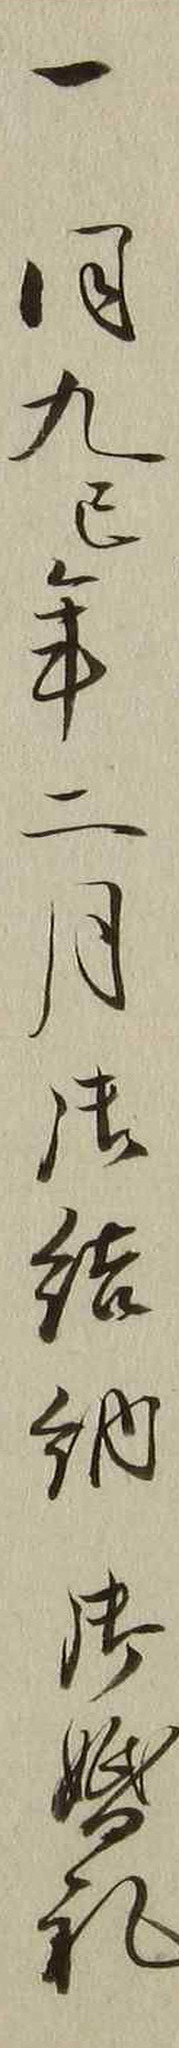一同九巳年二月御結納御婚礼
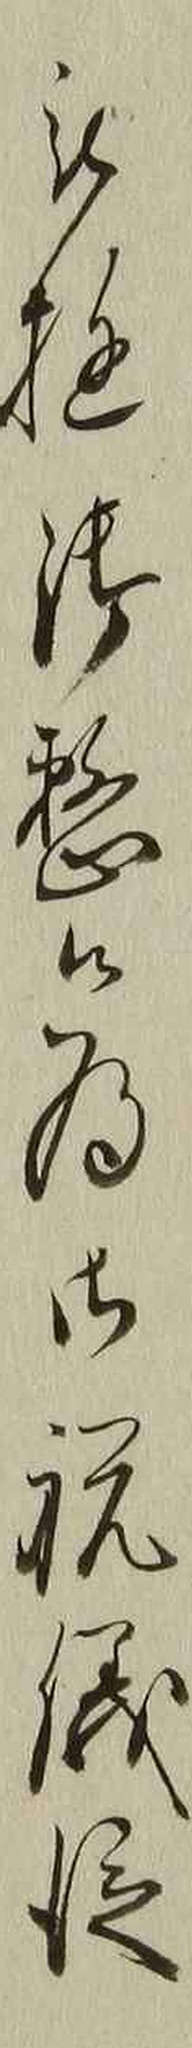被遊御整候為御祝儀従
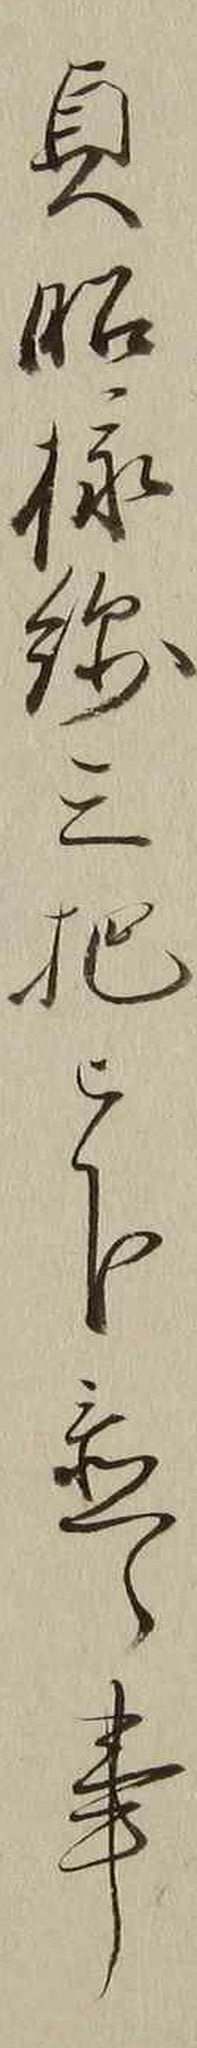貞昭様綿三把被下置候事
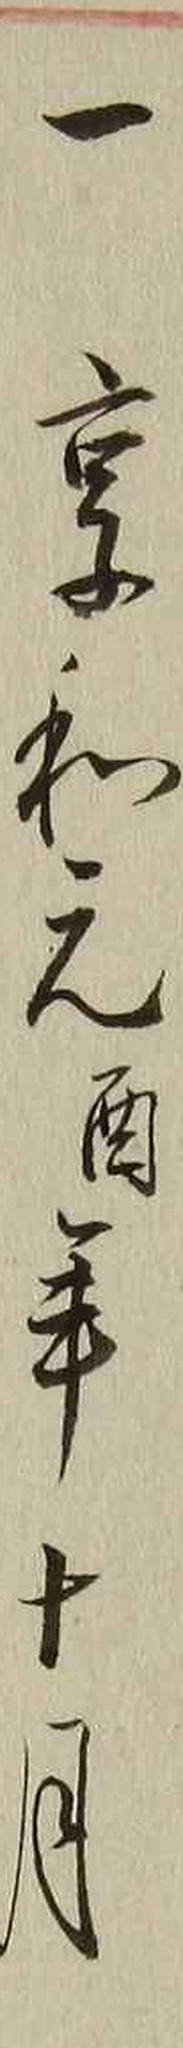一享和元酉年十月
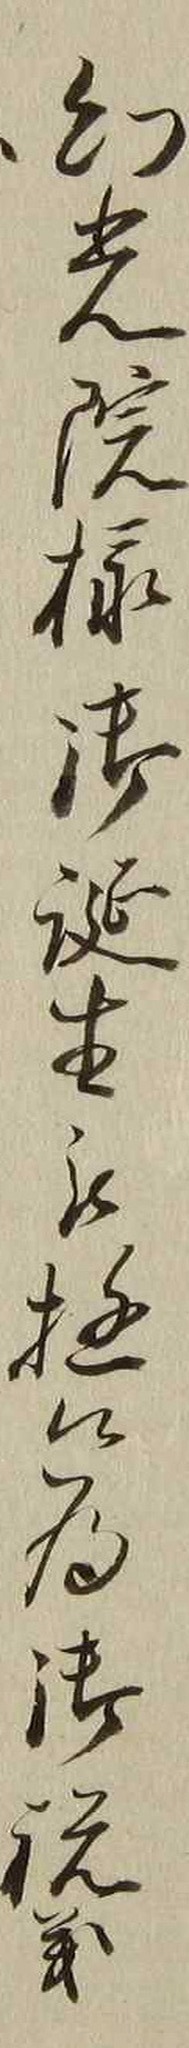幻光院様御誕生被遊候為御祝義
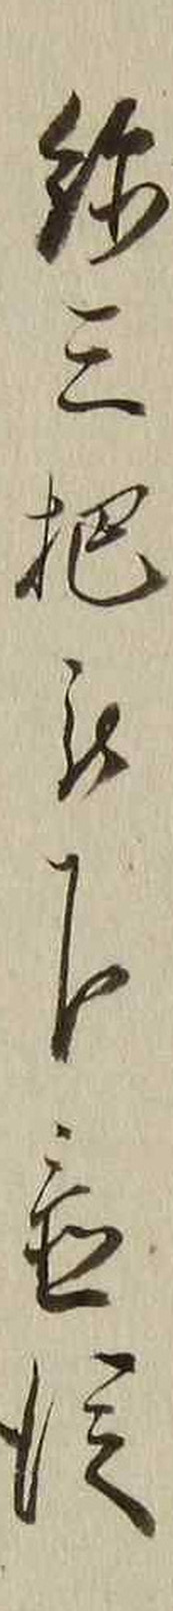綿三把被下置従
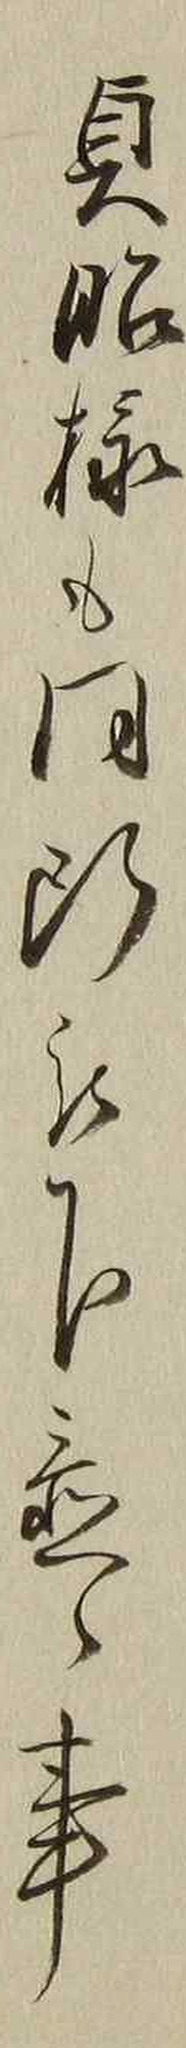貞昭様も同断被下置候事
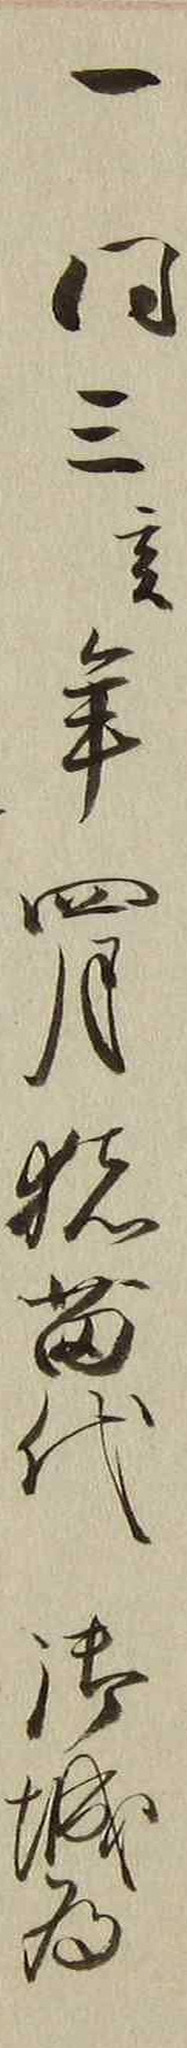一同三亥年四月猪苗代御城為
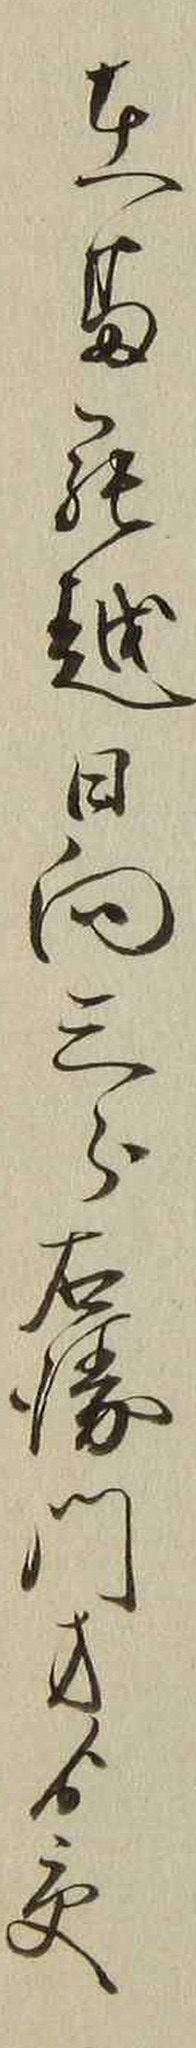在番罷越日向三郎右衛門方ゟ受
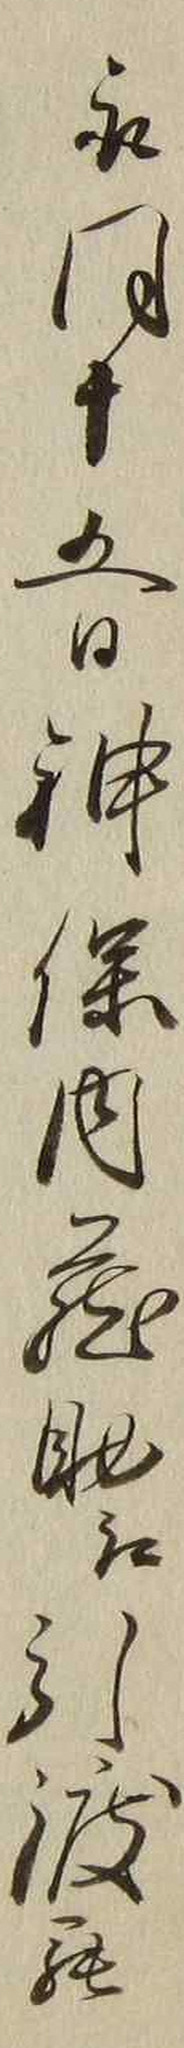取同十五日神保内蔵助江引渡罷
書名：諸士系譜　巻之103　か之部11
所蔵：会津若松市立会津図書館
